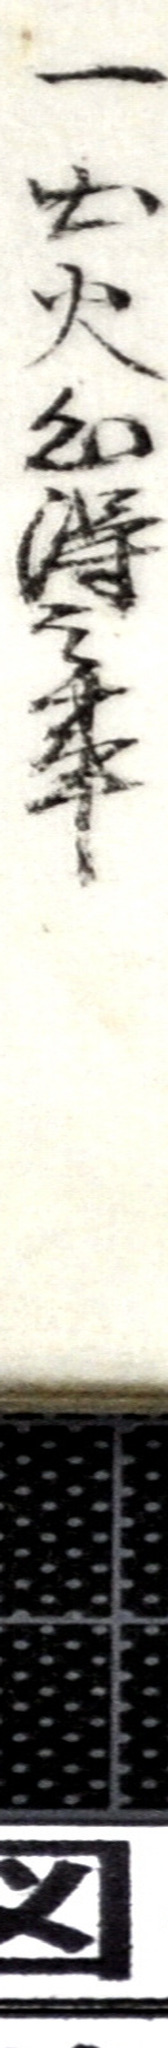一出火心得之事
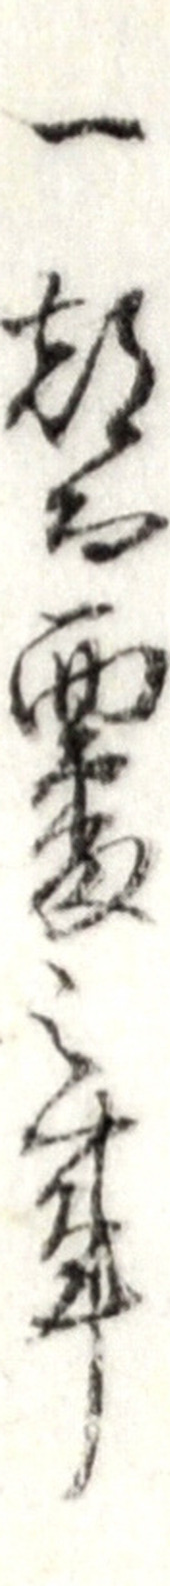一都而西処之事
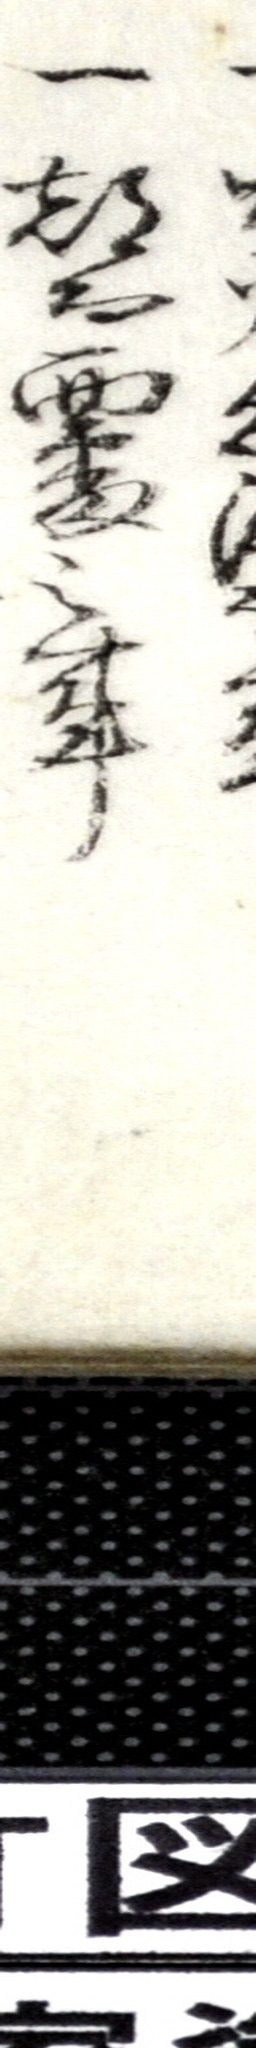一都而西処之事
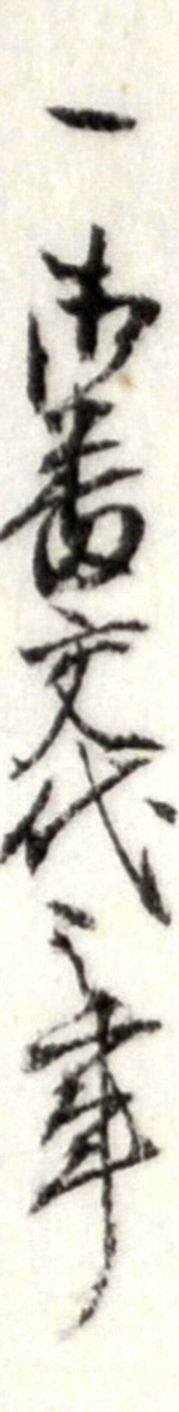一御番交代之事
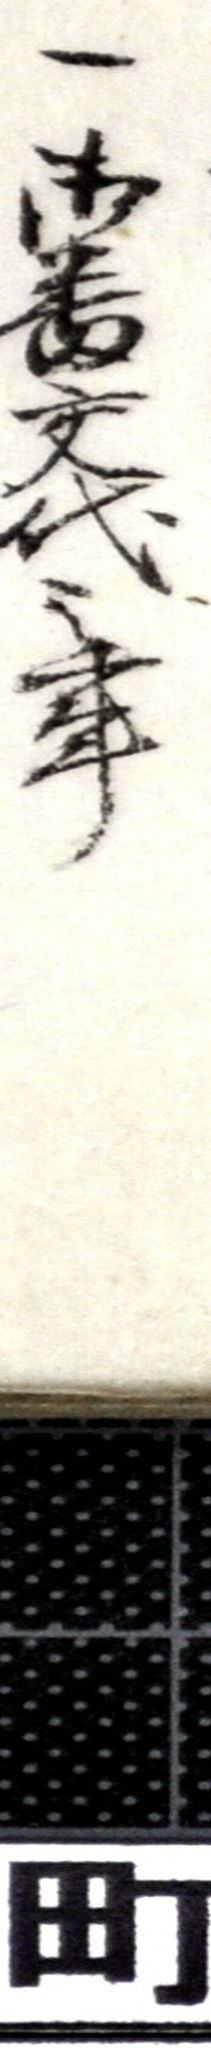一御番交代之事
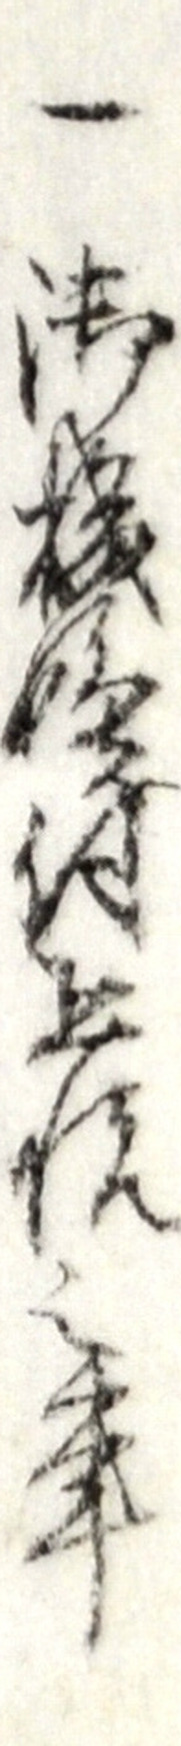一御機嫌伺上様之事
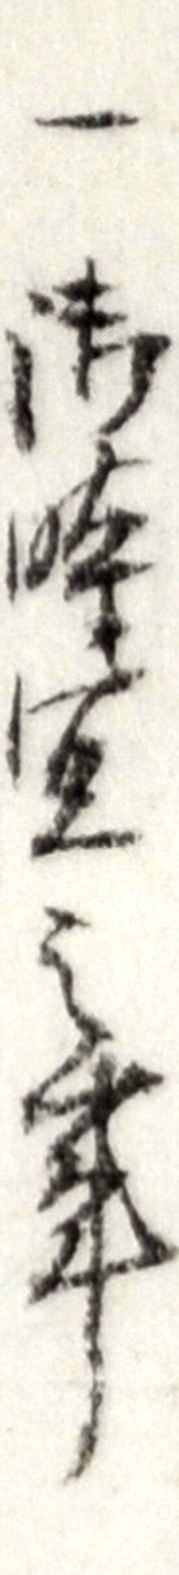一御時宜之事
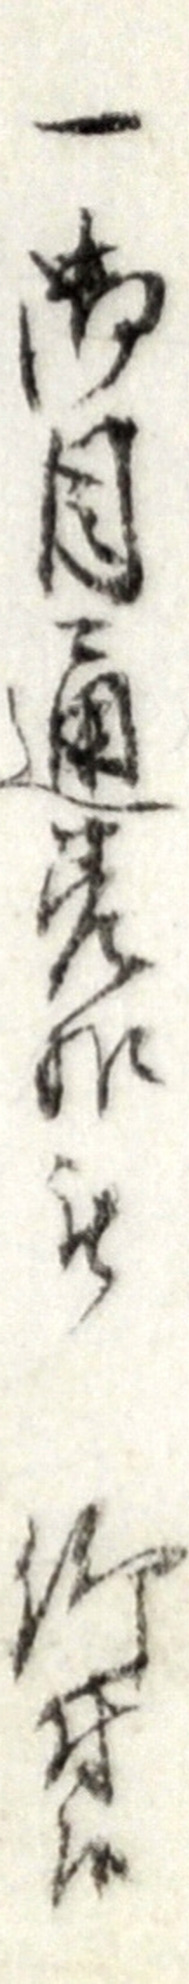一御目通差控被仰付候
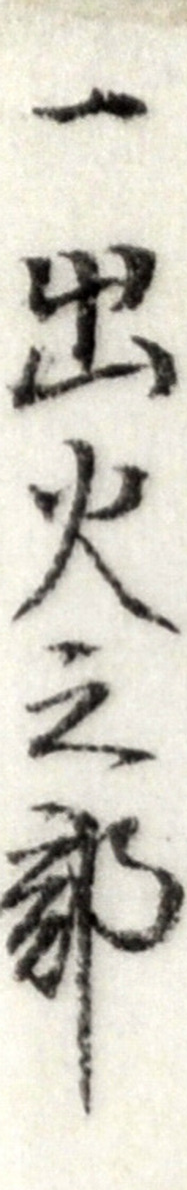一出火之部
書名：御番方勤仕録
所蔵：伊那市立高遠町図書館・合同会社AMANE
